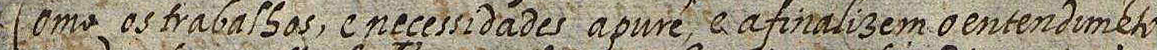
Como os trabalhos, e neçessidades apurē, e afinalizem o entendimēto
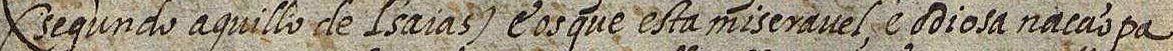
(segundo aquillo de Isaias) e os que esta miserauvel, e odiosa nacaõ pa
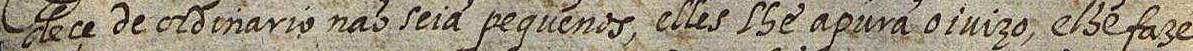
desse de ordinario naõ seiā pequenos, elles lhe apura o iuizo, e lhe fazē
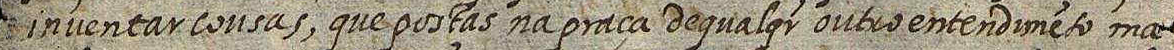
inuentar cousas, que postas na praça de qualqr̄ outro entendimēto ma
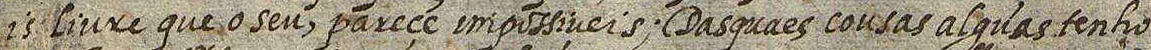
is liure que o seu, pareçē impossiueis; Das quaes cousas algūas tenho
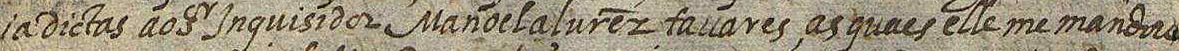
ia dictas ao sor Inquisidor Manoel alurēz tauares, as quaes elle me mandou
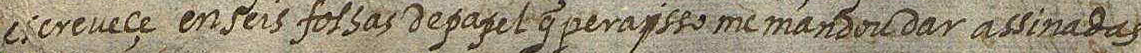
escreueçe en seis folhas de papel q̄ pera ysso me mandou dar assinadas
